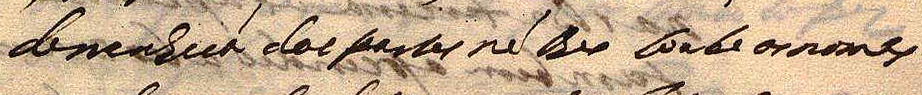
de nenhuā das partes nē lhes soube os nomes
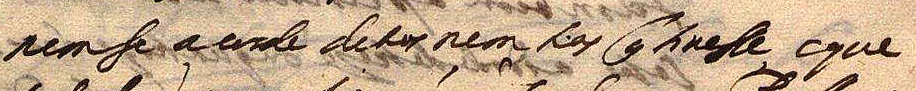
nem se acorde de tios nem tias q̄ tiuesse e que
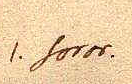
1. soror.
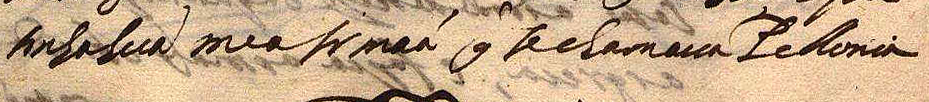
tinha huā mea Irmaā q̄ se chamaua Pellonia
